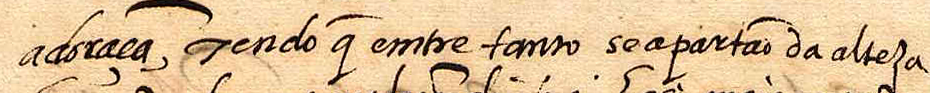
adoraçā, sendo q̄ emtretanto se apartão da alteza
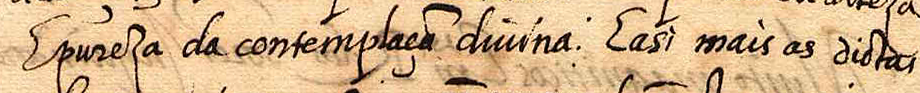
E pureza da contemplaçā diuina: E asi mais as dictas
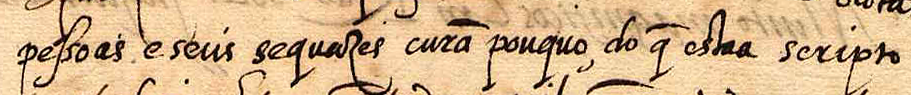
pessoas e seus sequazes curā pouquo, do q̄ estaa scripto
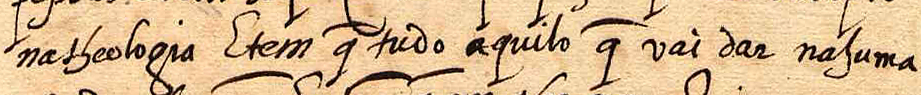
na theologia E tem q̄ tudo aquilo q̄ vai dar na huma
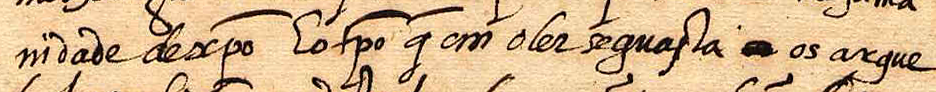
nidade de xp̄o E o tp̅o q̅ em o ler se guasta _ os argue
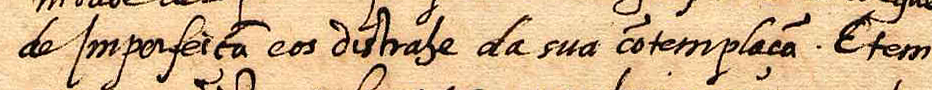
de Jmperfeiçā e os distrahe da sua cōtemplaçā. E tem
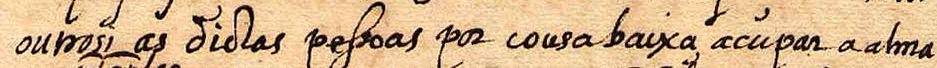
outrosi as dictas pessoas por cousa baixa occupar a alma
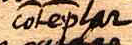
c̄ot̄eplar
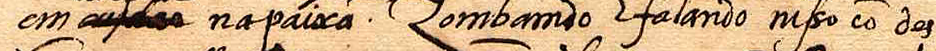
em _ na paixā. Zombamdo E falando nisso c̄o des
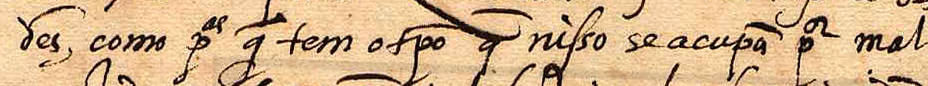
dēs, como pas q̄ tem o tp̅o q̅ nisso se occupā por mal
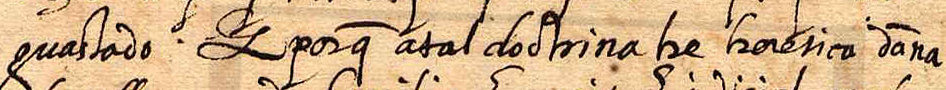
guastado. E porq̄ a tal doctrina he heretica dāna
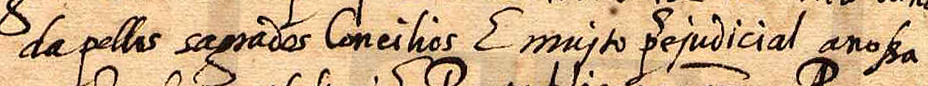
da pellos sagrados Concilios E mujto p̄ejudicial a nossa
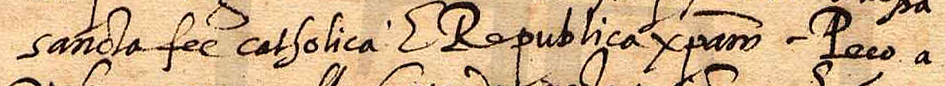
sancta fee catholica E Republica x̄pam. Peço a
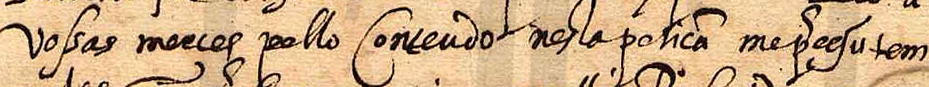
vossas merces pello Conteudo nesta petiçā me p̄egūtem
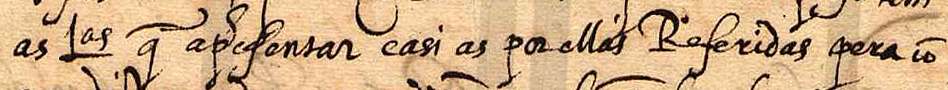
as tas q̄ ap̄esentar e asi as por ellas Referidas pera c̄o
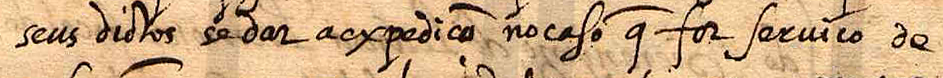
seus dictos se dar a expediç̄o no caso q̄ for seruiço de
